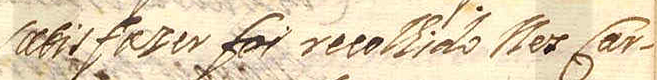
satisfazer foi recolhido Nos Car
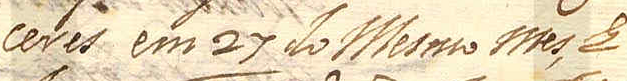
ceres em 27 do Mesmo mes, E
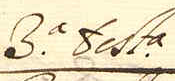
3.a test.a
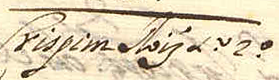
Crispim Roiz̄ 1.o 2.o
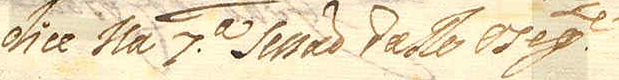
dice Na 7.a sessão da Re o seg.te
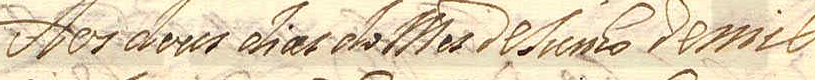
Aos dous dias do Mes de Iunho de mil
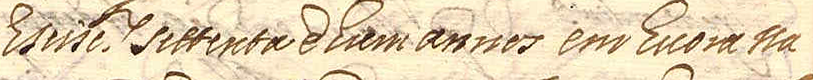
E seisc.tos settenta E hum annos em Euora na
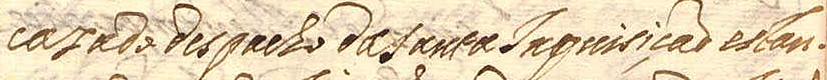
caza do despacho da santa Inquisição estan
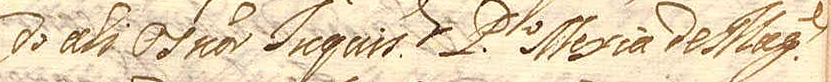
do ahi O snōr Inquis.or P.o Mexia de Mag.es
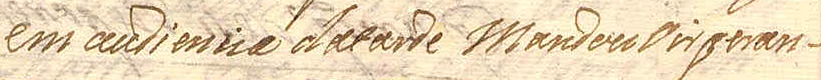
em audiencia da tarde Mandou vir peran
